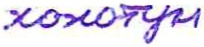хохотун
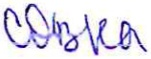совка
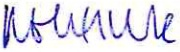пыжик
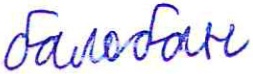балобан
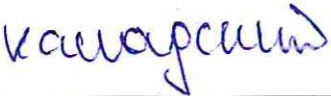канадский
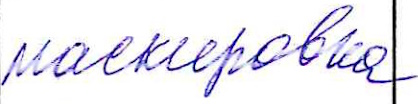маскировка
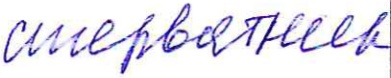стервятник
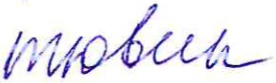тювик
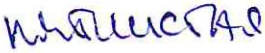пятнистая
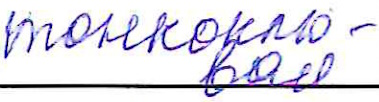тонкоклю-вая
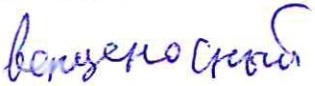венценосный
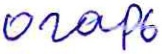огарь
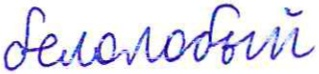белолобый
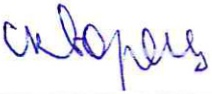скворец
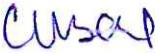сизая
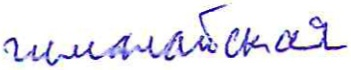гималайская
